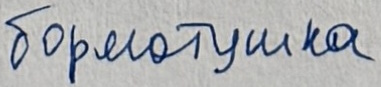бормотушка
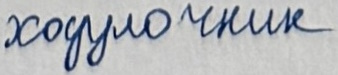ходулочник
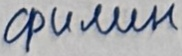филин
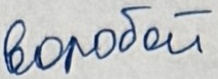воробей
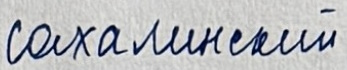сахалинский
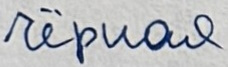чёрная
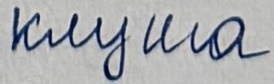клуша
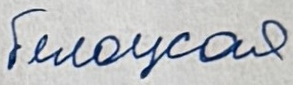белоусая
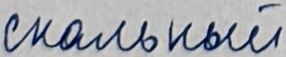скальный
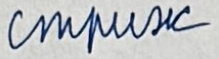стриж
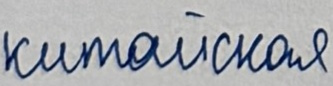китайская
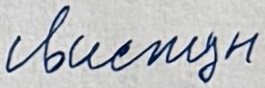свистун
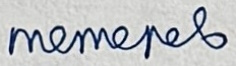тетерев
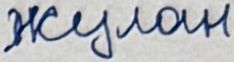жулан
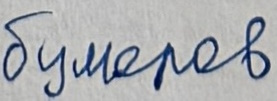бумеров
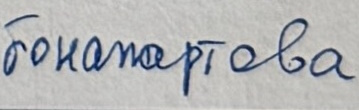бонапартова
